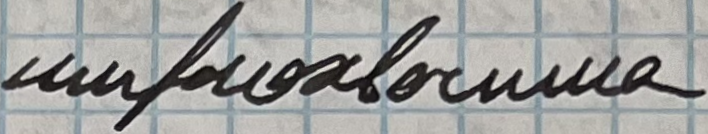широкохвостка
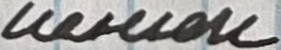канюк
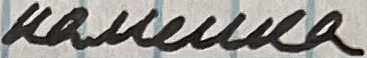каменка
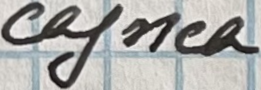саджа
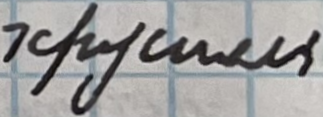хрустан
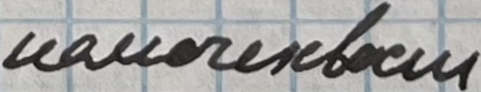колючехвост
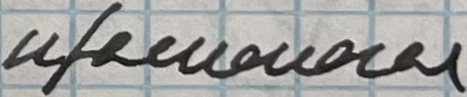красноногая
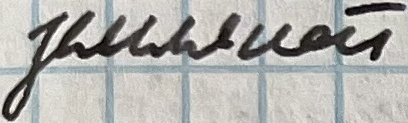земляной
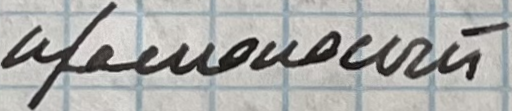красноносый
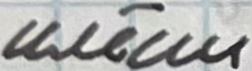клёст
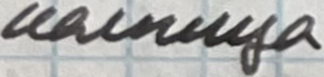колпица
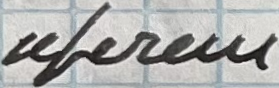кречет
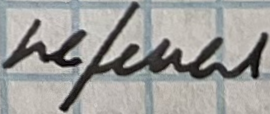перепел
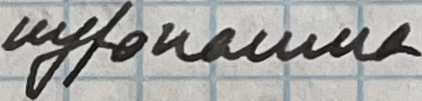куропатка
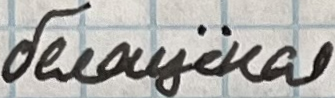белощёкая
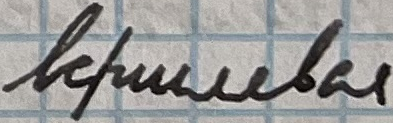вертлявая
